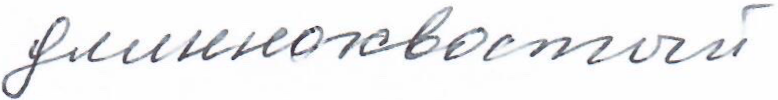длиннохвостый
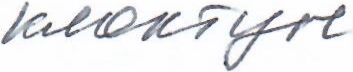клоктун
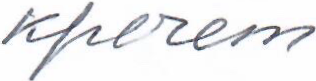кречет
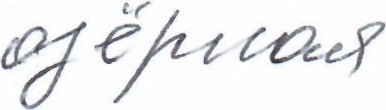озёрная
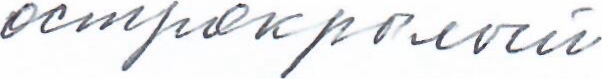острокрылый
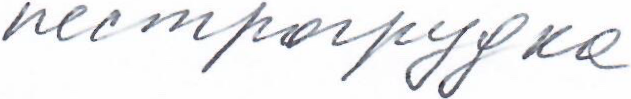пестрогрудка
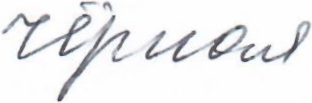чёрная
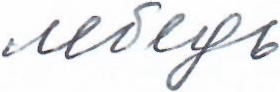лебедь
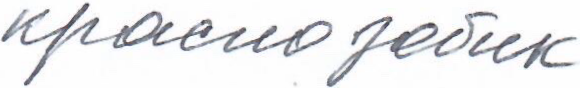краснозобик
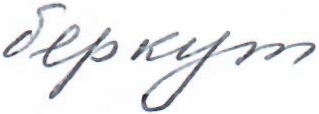беркут
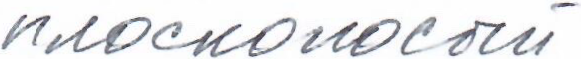плосконосый
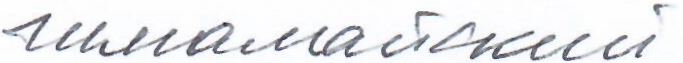гималайский
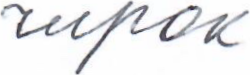чирок
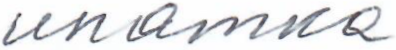ипатка
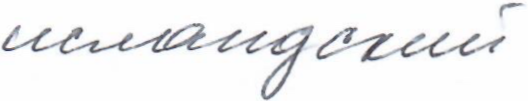исландский
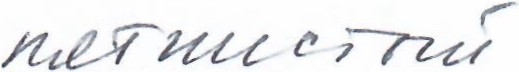пятнистый
